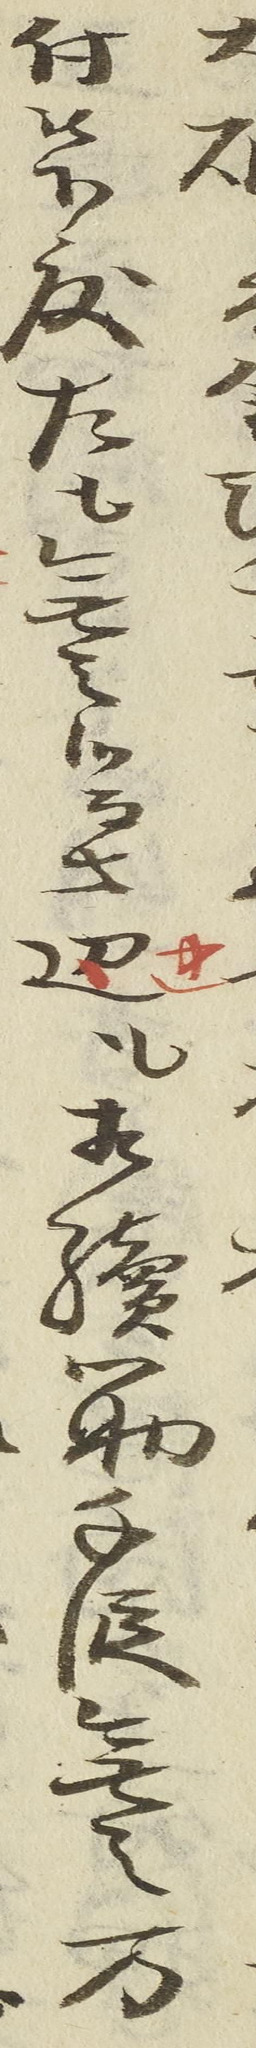付被下度左も無之候而は辺も相続筋手段無之万
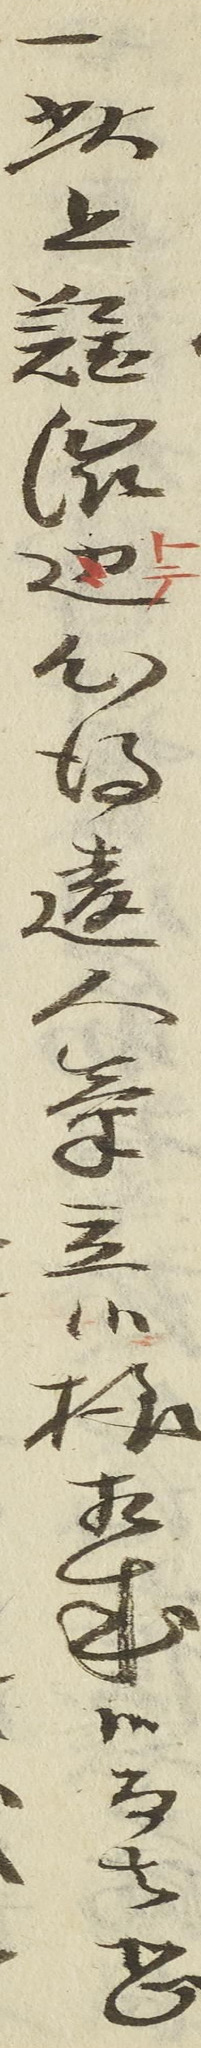一此上難渋迚心得違人気立候様被成候而は恐
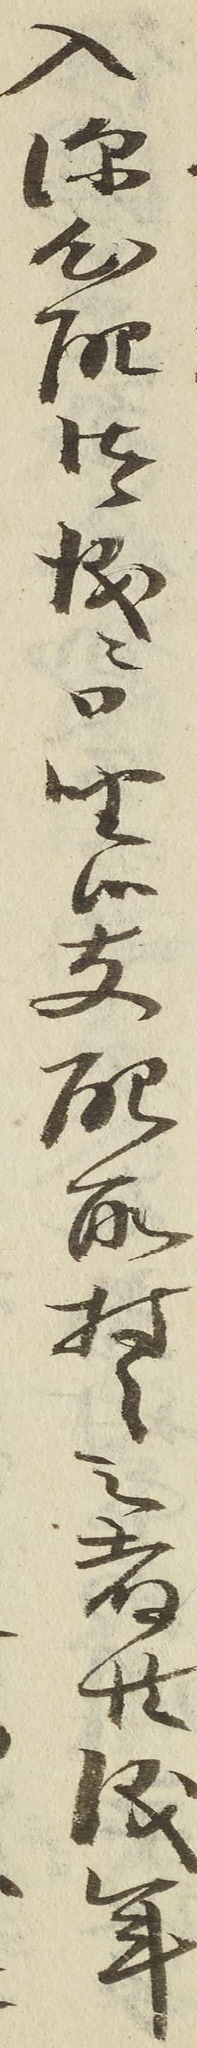入深心配仕候儀二御座候支配所村々之者共儀年
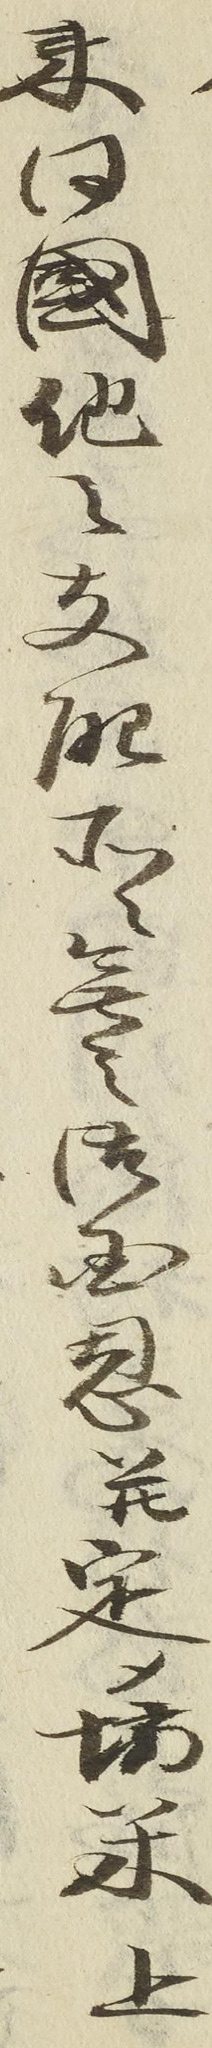来同国他之支配所二無之御国恩并定メ増米上
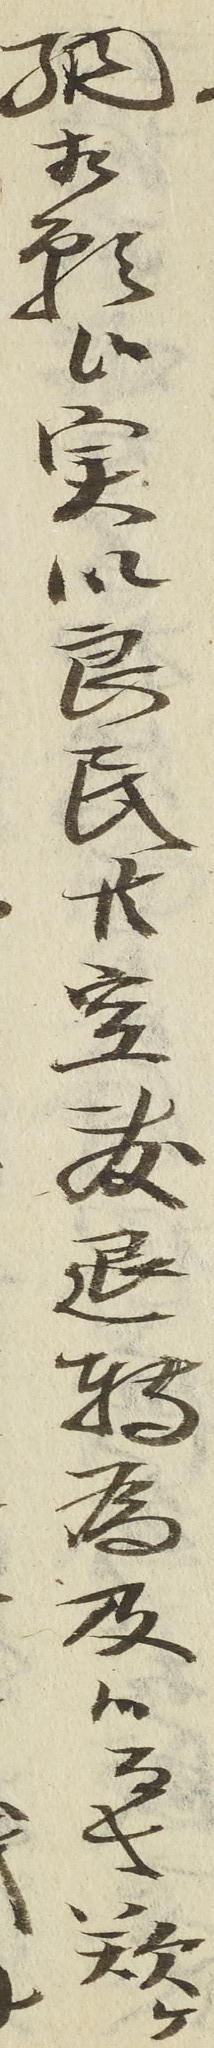納相願候実以良民共空敷退転為及候而は歎ヶ
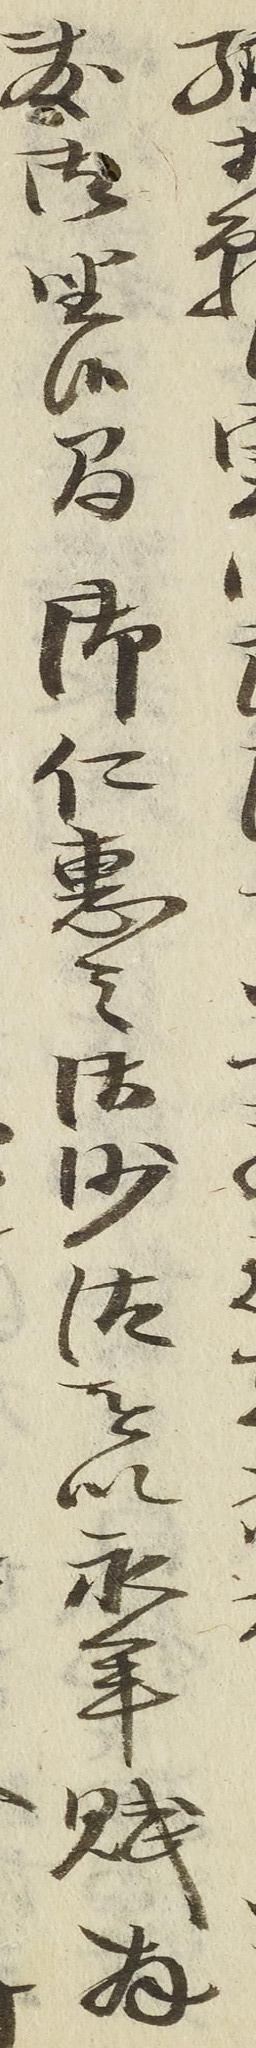敷御坐候間御仁恵之御沙汰を以永年賦拝
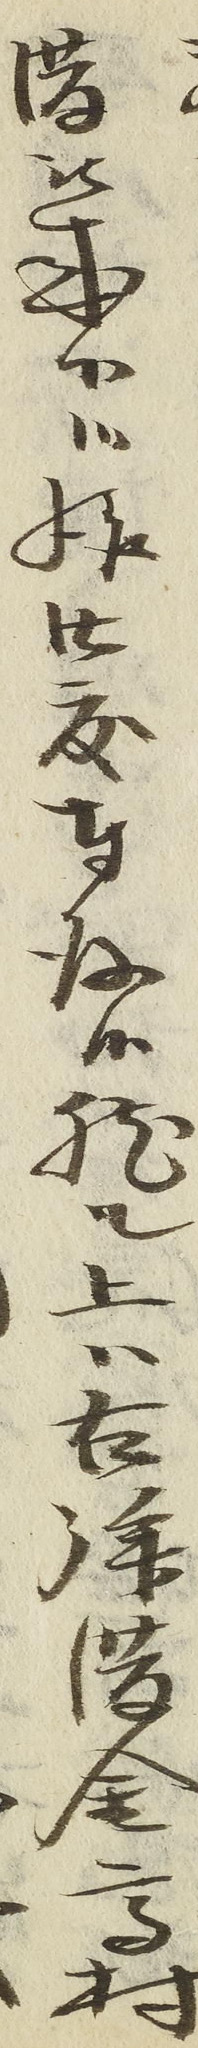借被成候様仕度奉存候然ㇽ上ハ右拝借金高村
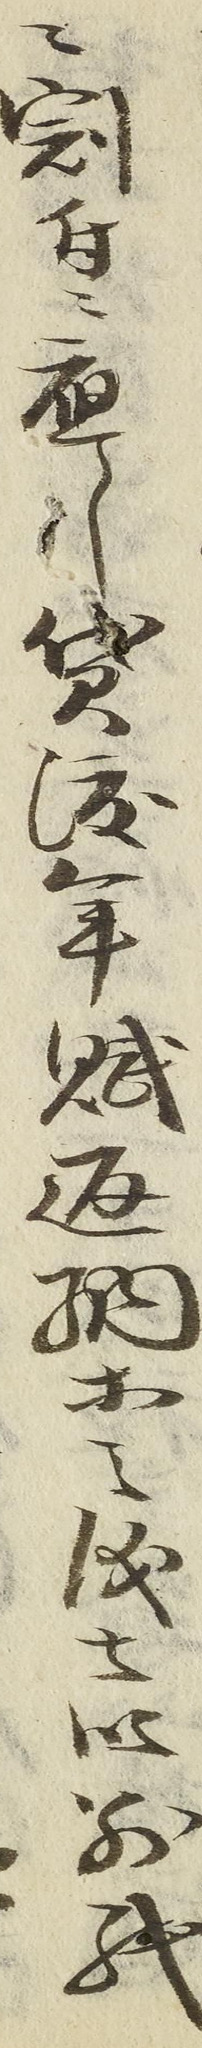々割付二応し貸渡年賦返納等之儀は御別紙
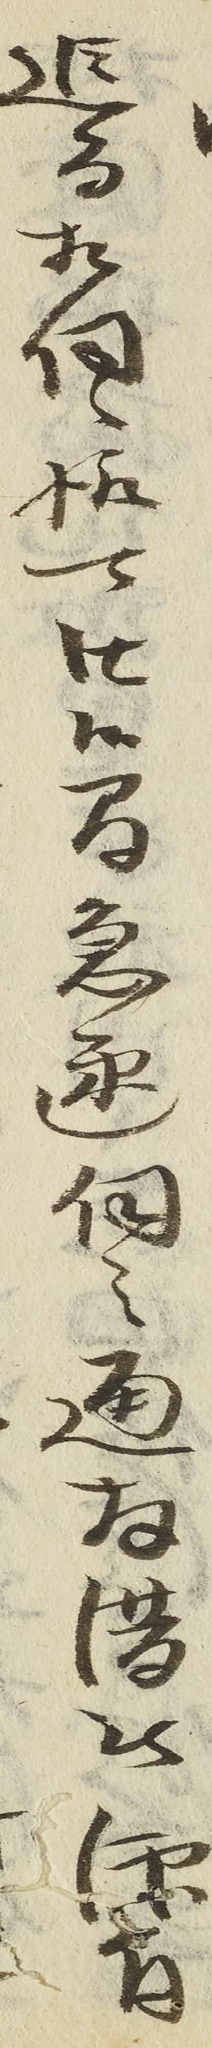追而相伺候様可仕候間急速伺之通拝借被仰付
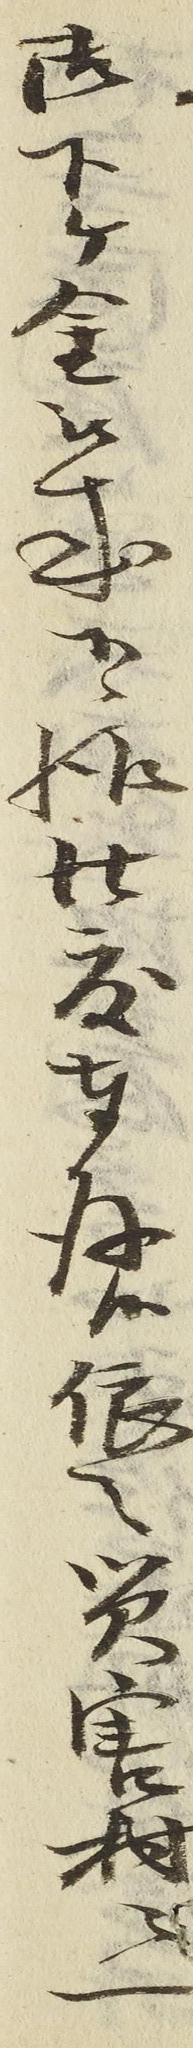御下ヶ金被成下候様仕度奉存候依之災害村々之一
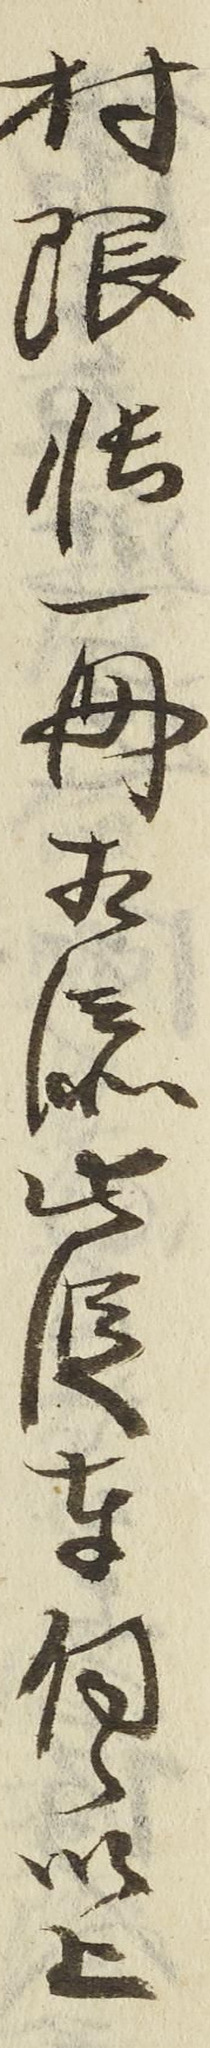村限帳一冊相添此段奉伺候以上
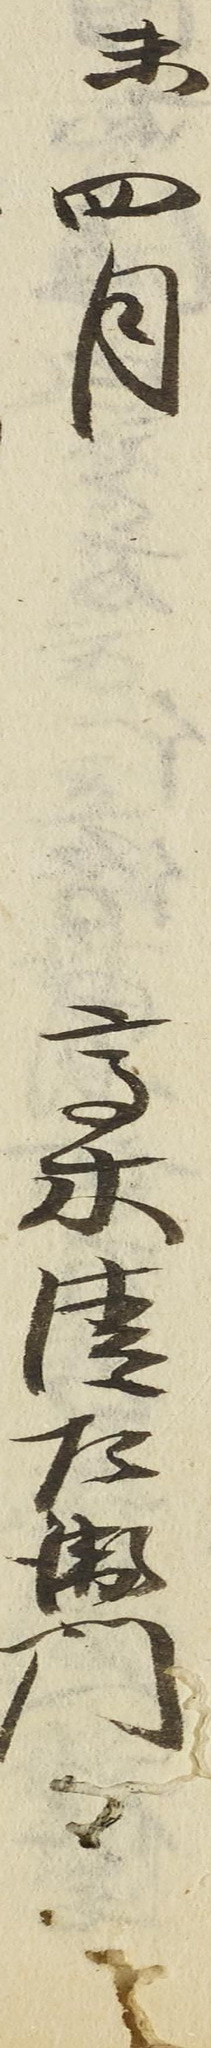未四月高木清左衛門
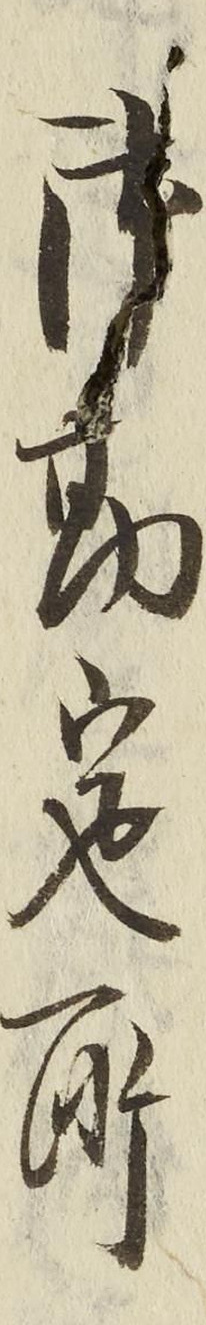御勘定所
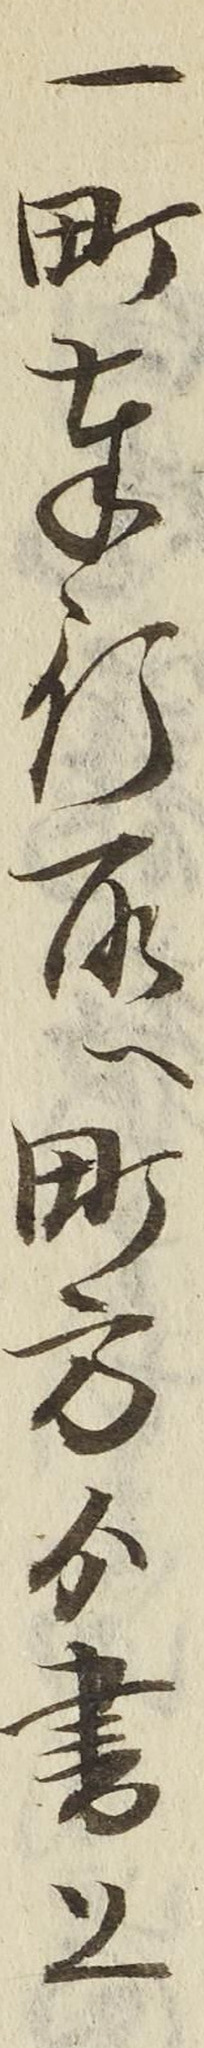一町奉行所へ町方ゟ書上
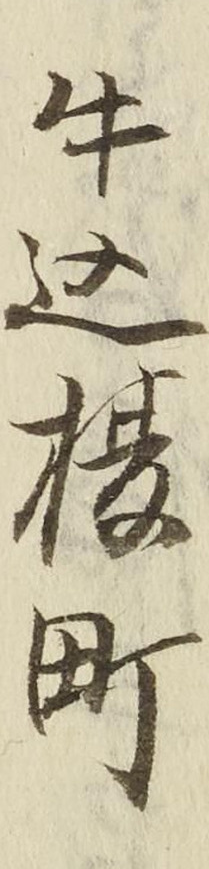牛込榎町
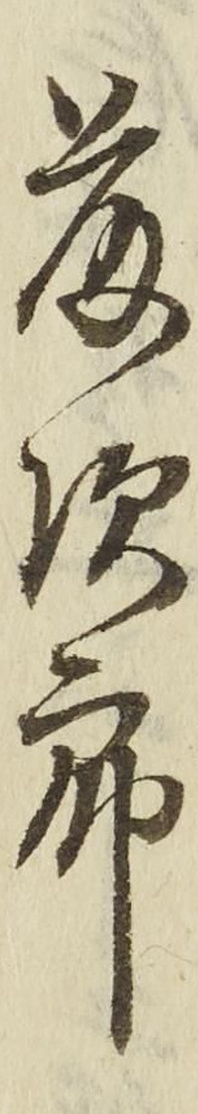藤次郎
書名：信濃國大地震記　乾
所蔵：東京大学地震研究所図書室 Earthquake Research Institute Library, The University of Tokyo, JAPAN
